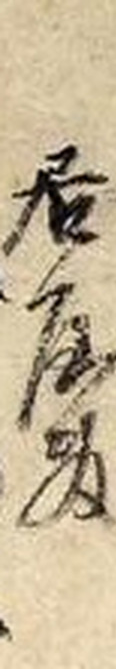居屋敷
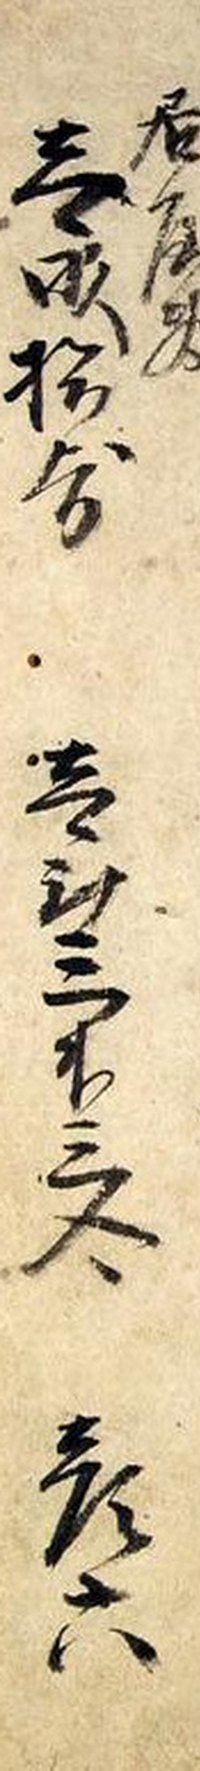壱畝拾歩壱斗三升三合彦六

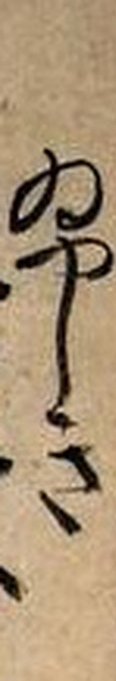ゐやしき
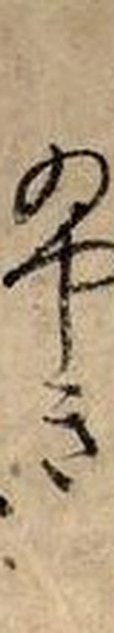ゐやしき
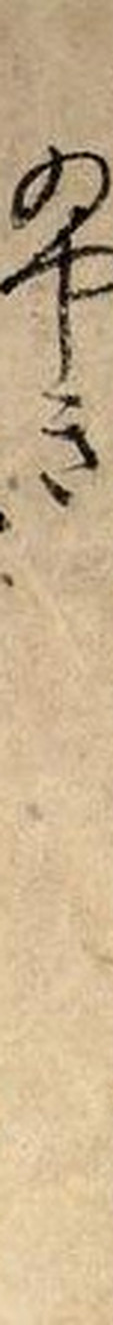ゐやしき
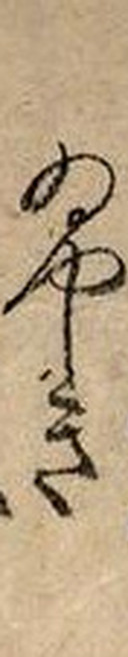ゐやしき
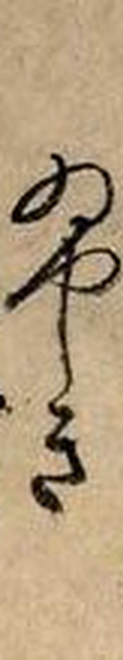ゐやしき
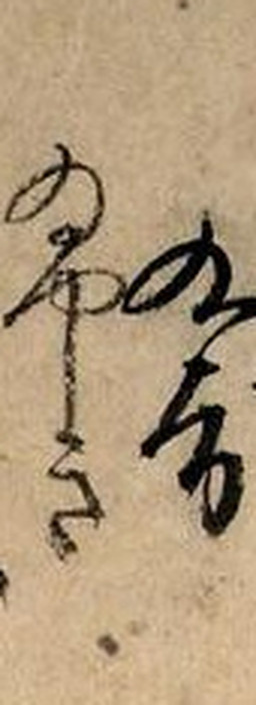ゐやしき
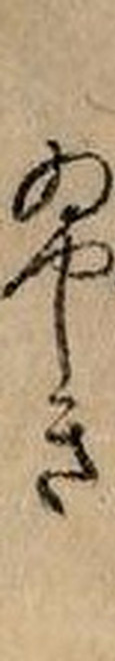ゐやしき
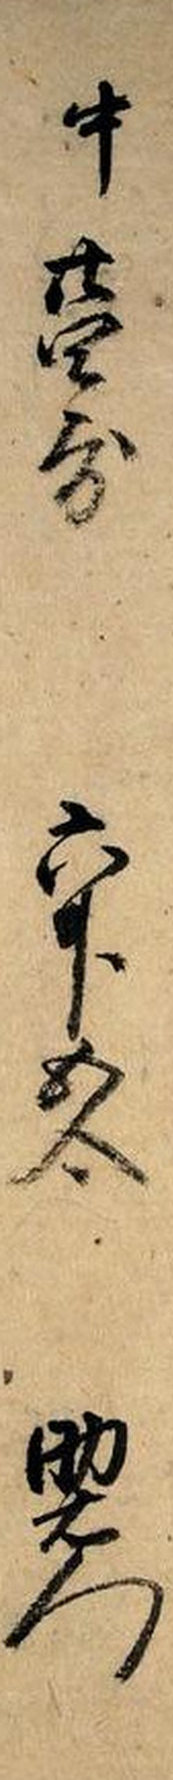中廿四歩六升五合助右衛門
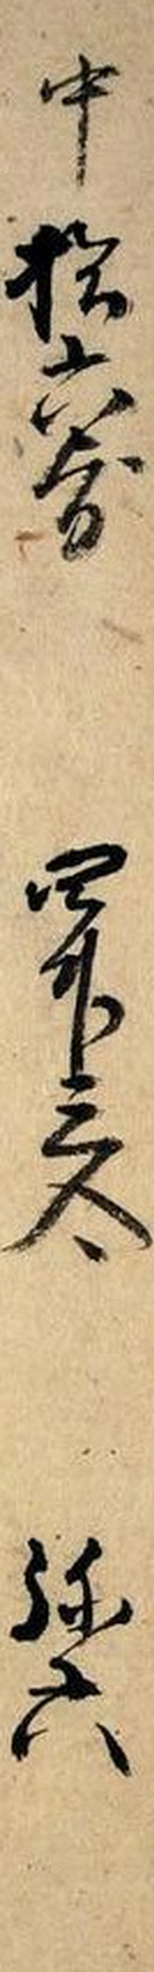中拾六歩四升三合弥六
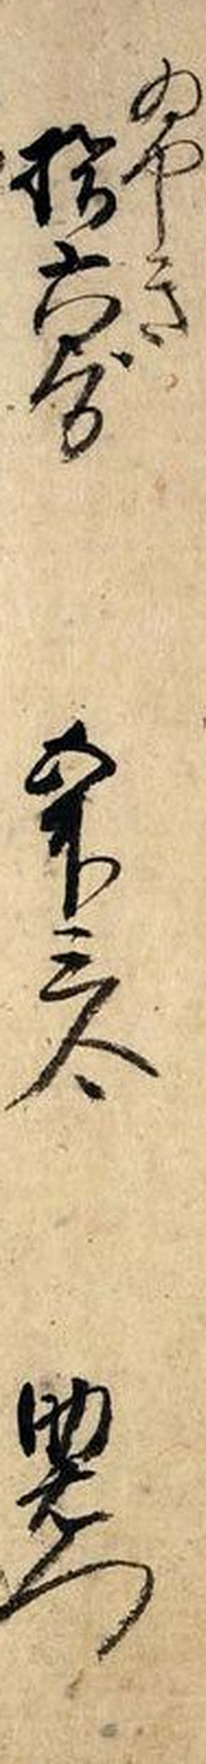拾六歩五升三合助右衛門
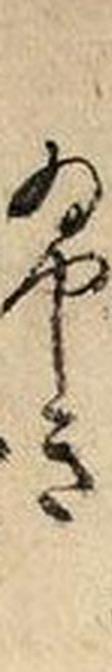ゐやしき
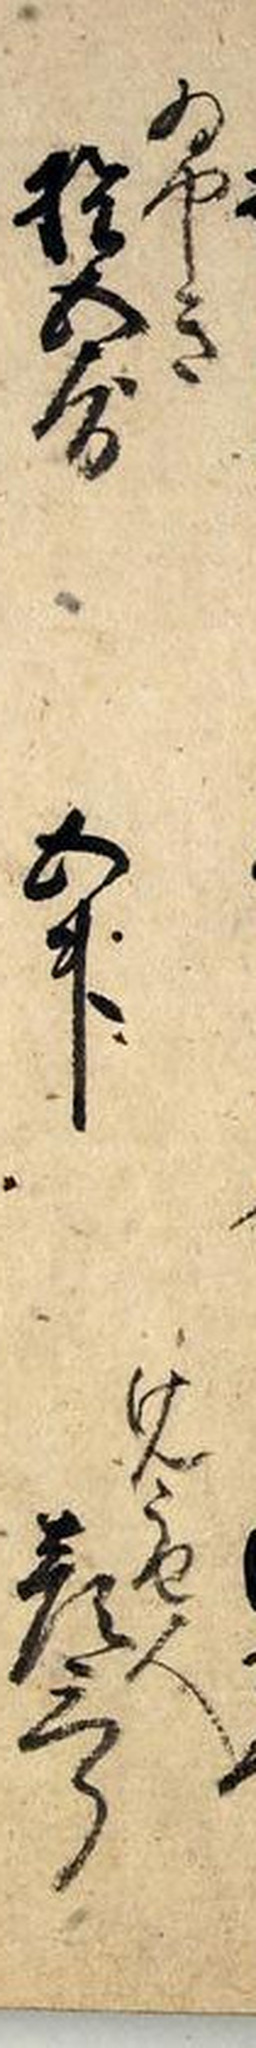拾五歩五升彦三郎
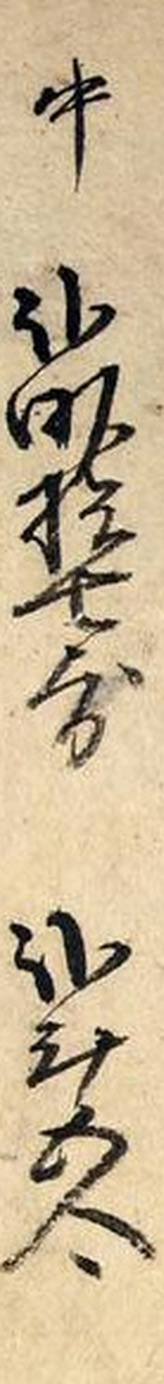中弐畝拾七歩弐斗五合下
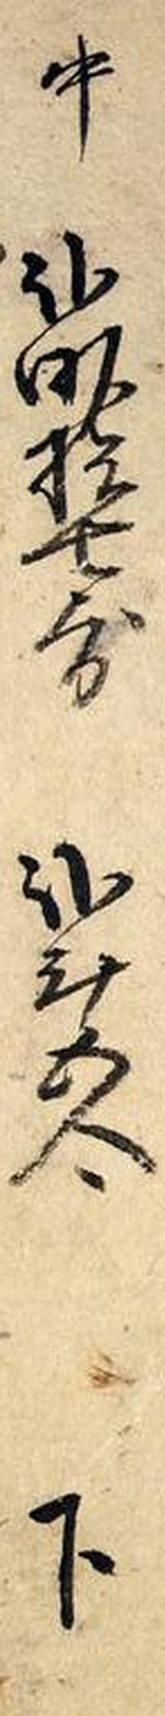中弐畝拾七歩弐斗五合下
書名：若州三方郡之内世久見浦御検地帳（世久見浦検地帳写）
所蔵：福井県文書館 Fukui Prefectural Archives
